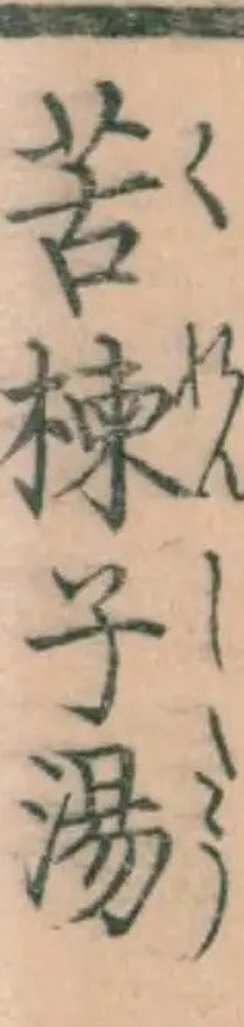苦楝子湯
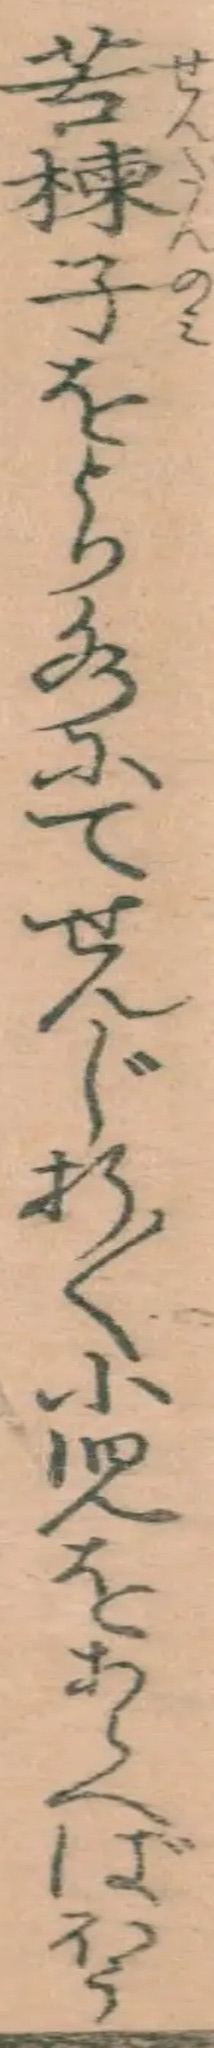苦楝子をとり水にてせんじ折々小児をあらへばほう
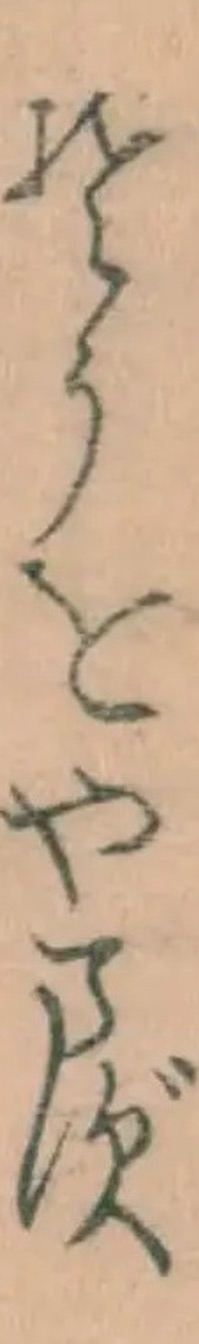そうをやまず
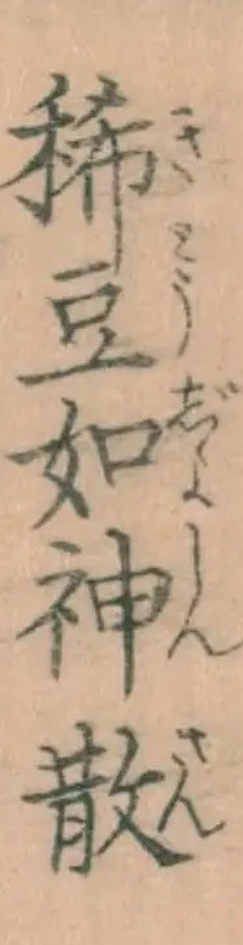稀豆如神散
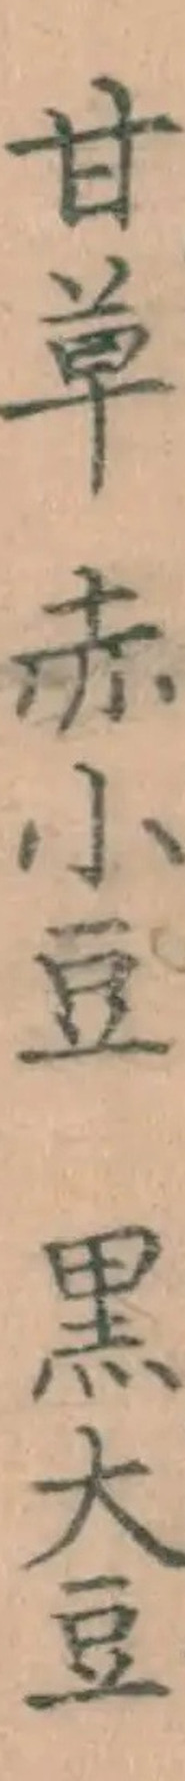甘草赤小豆黒大豆
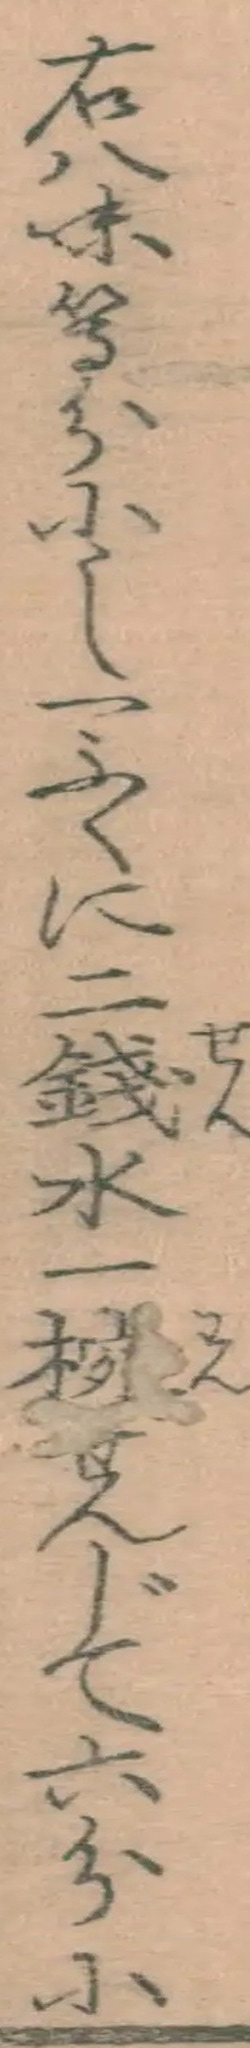右八味等分にし一ふくに二銭水一椀せんじて六分に

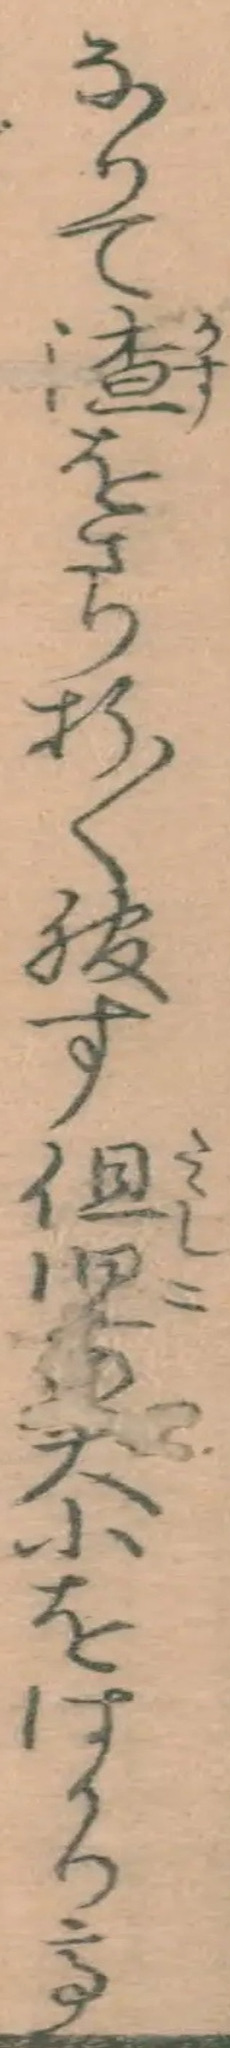なりて渣をさり折々服す但児▢大小をはかりて
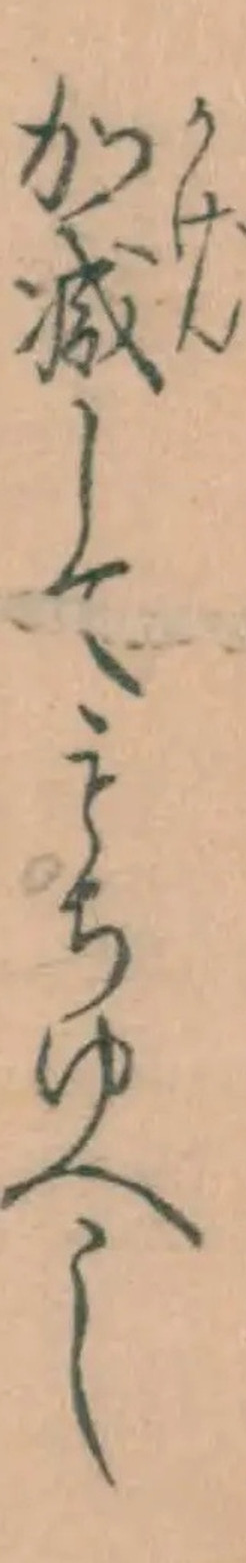加減してもちゆへし
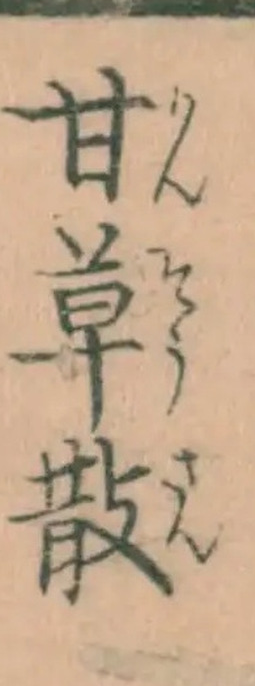甘草散
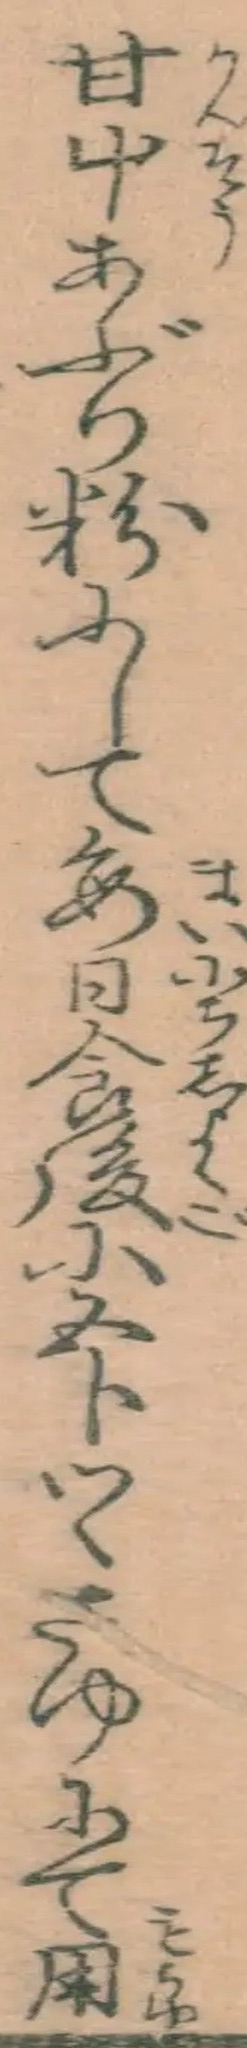甘屮あぶり粉にして毎日食後に五分つゝさゆにて用
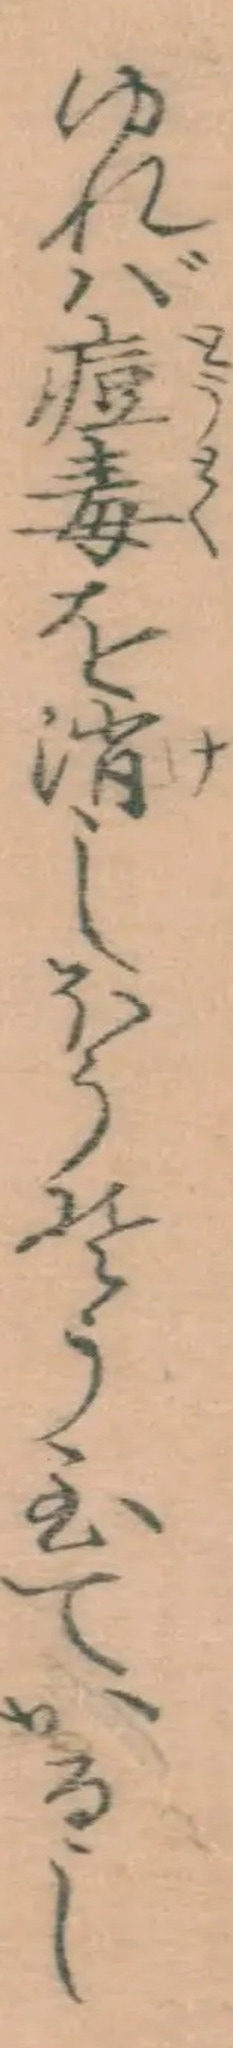ゆれば痘毒を消しほうそう至てかるし
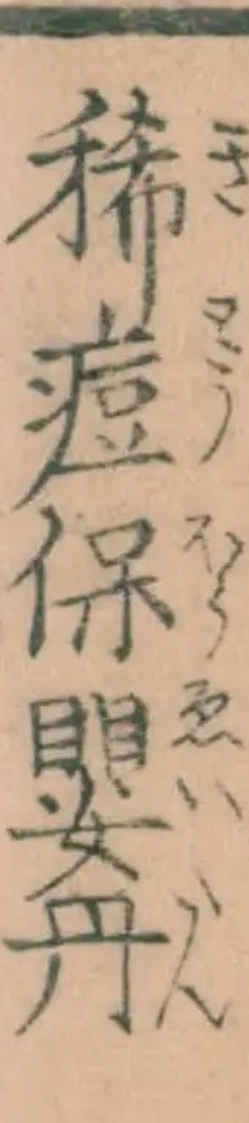稀痘保嬰丹
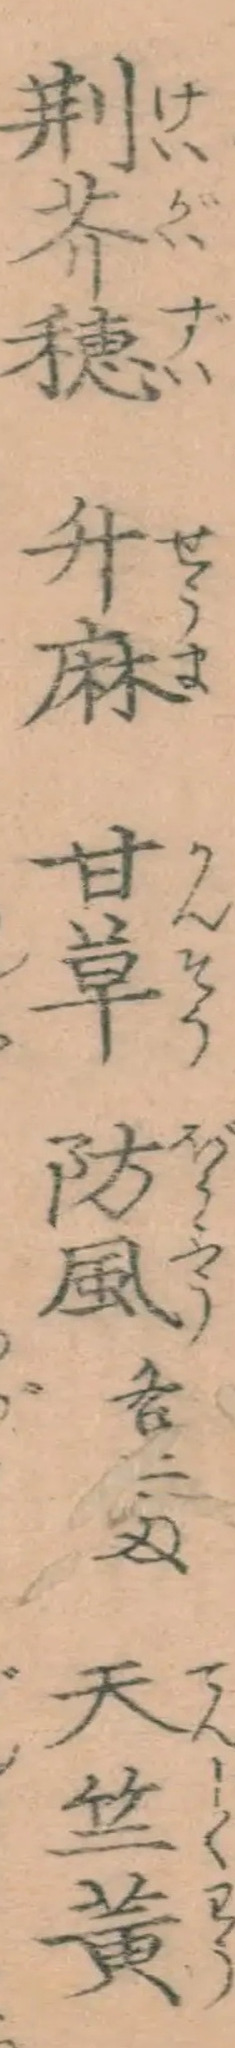荊芥穂升麻甘草防風各二両天竺黄
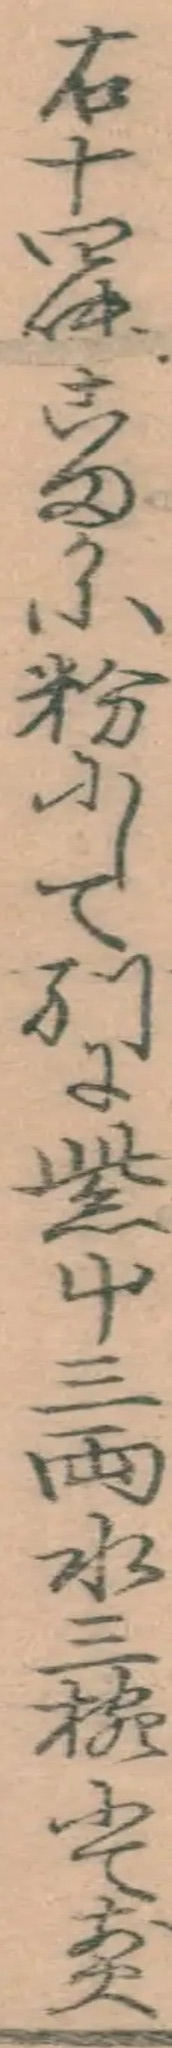右十四味こまかに粉にして別に紫屮三両水三椀にて煎
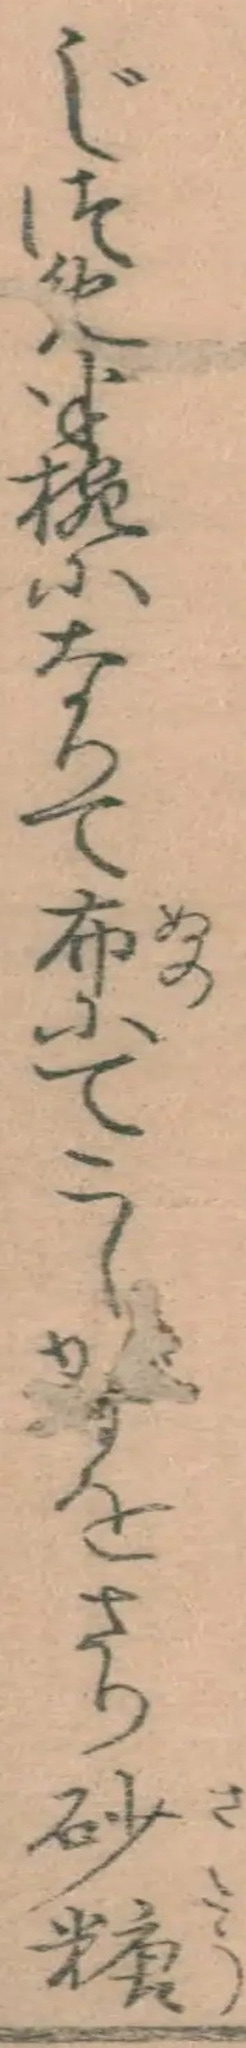じつめ半椀になりて布にてこしかすをさり砂糖

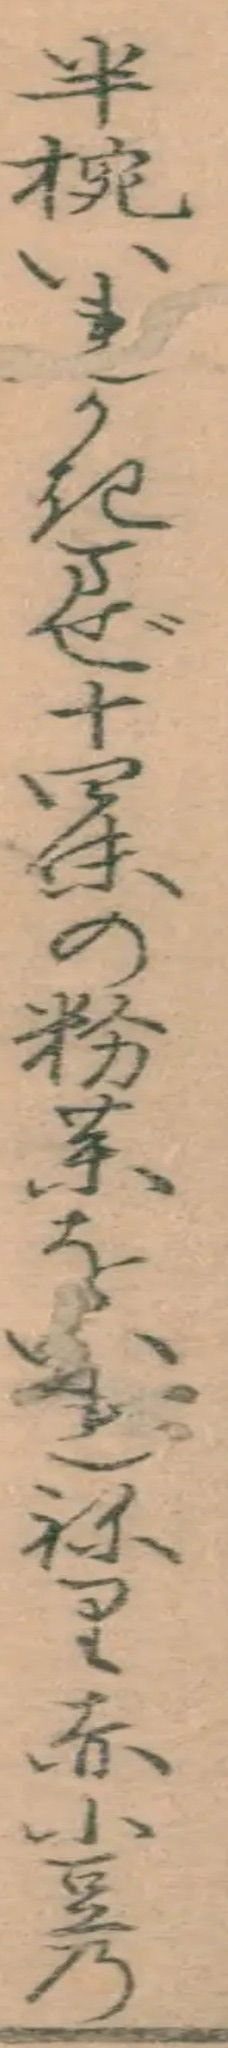半椀いれかきまぜ十四味の粉薬をいれねり赤小豆の
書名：雨夜談
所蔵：国立国会図書館 National Diet Library, JAPAN
